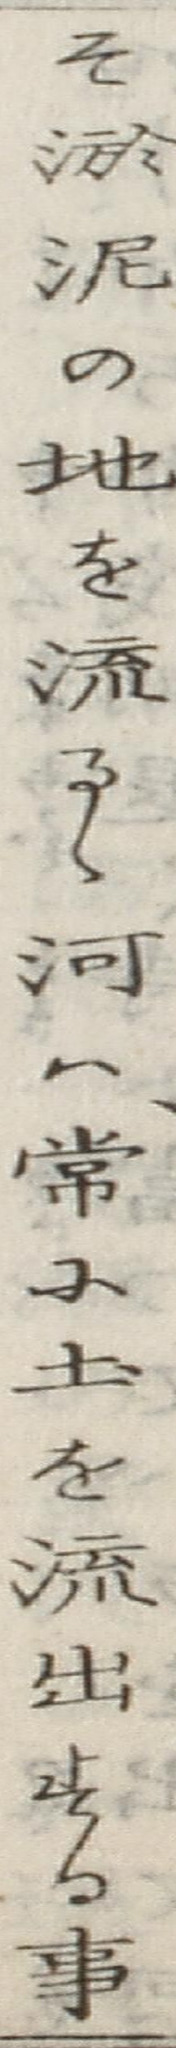そ淤泥の地を流るゝ河は、常に土を流出する事
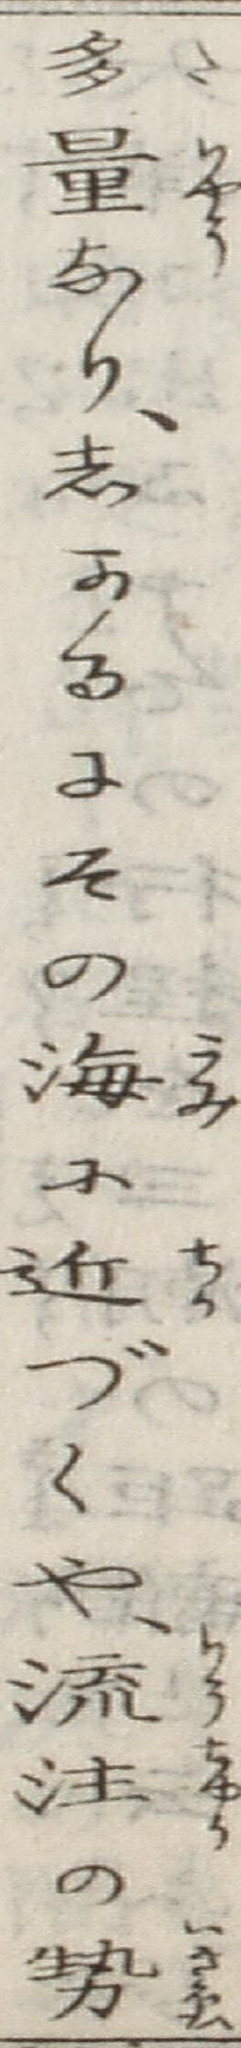多量なり、しかるにその海に近づくや、流注の勢
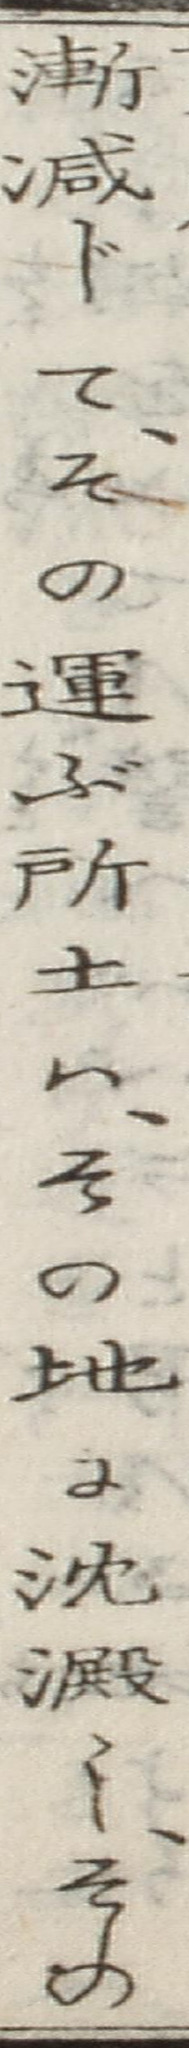漸減じて、その運ぶ所土は、その地に沈殿し、その
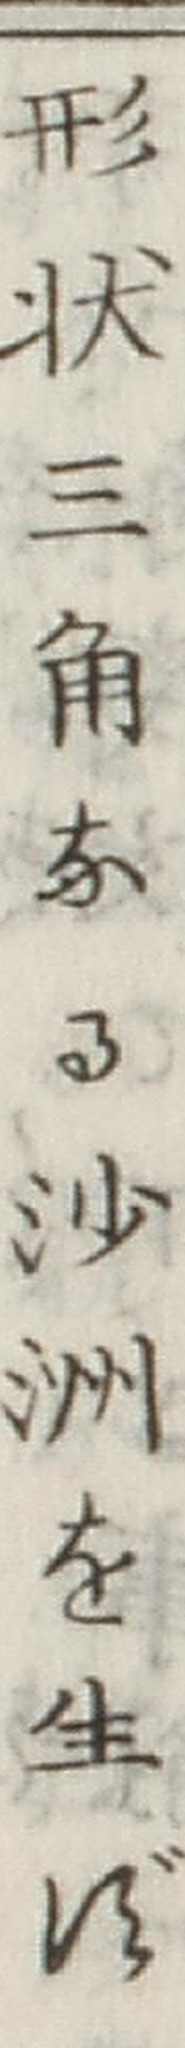形状三角なる沙洲を生ず
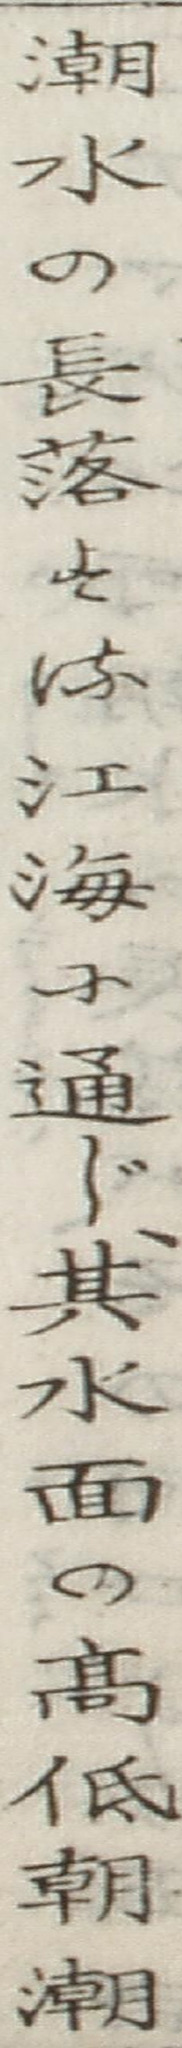潮水の長落する江海に通じ、其水面の高低朝潮
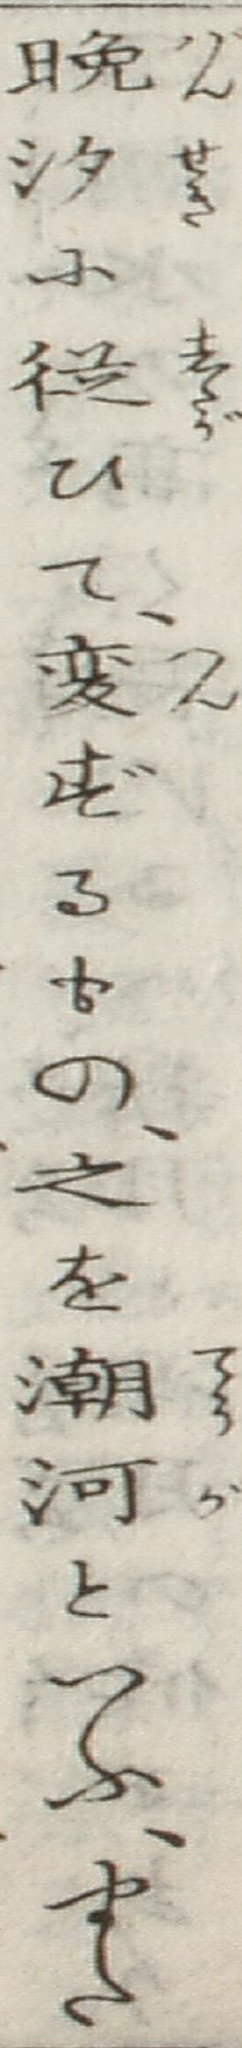晩汐に従ひて、変ずるもの、之を潮河といふ、また
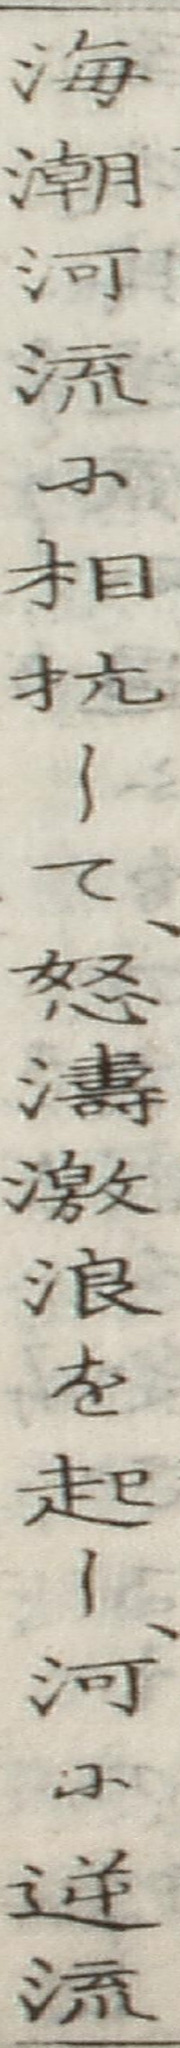海潮河流に相抗して、怒涛激浪を起し、河に逆流
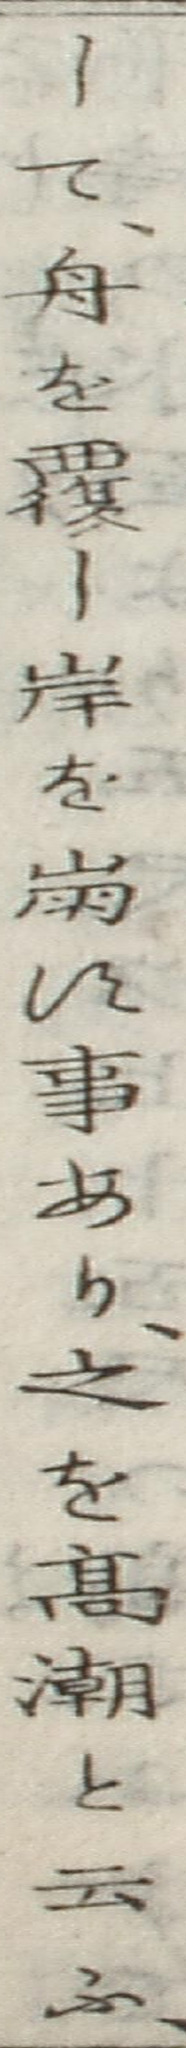して、舟を覆し岸を崩す事あり、之を高潮と云ふ、

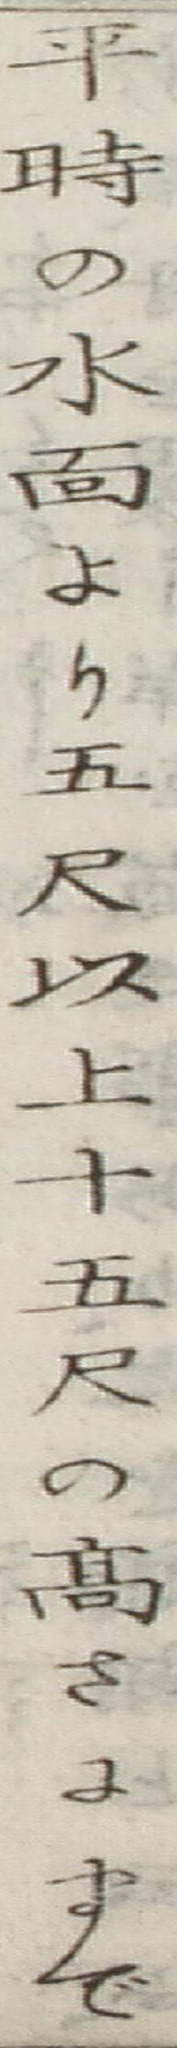平時の水面より五尺以上十五尺の高さにまで
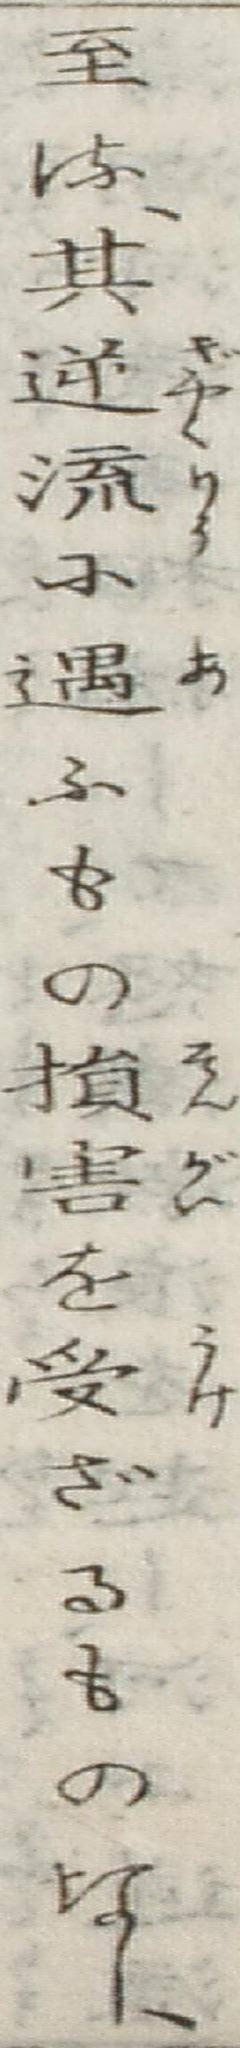至る、其逆流に遇ふもの損害を受ざるものなし、
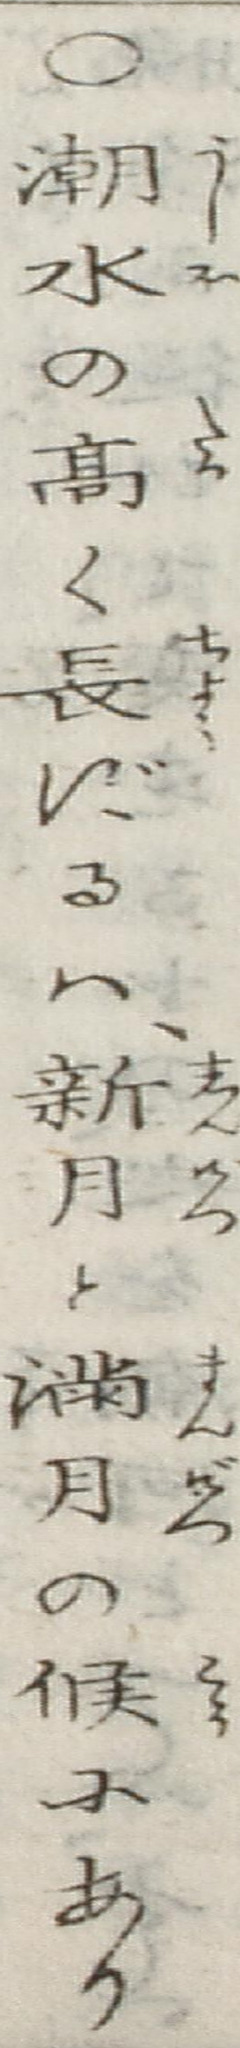○潮水の高く長ずるは、新月と満月の候にあり
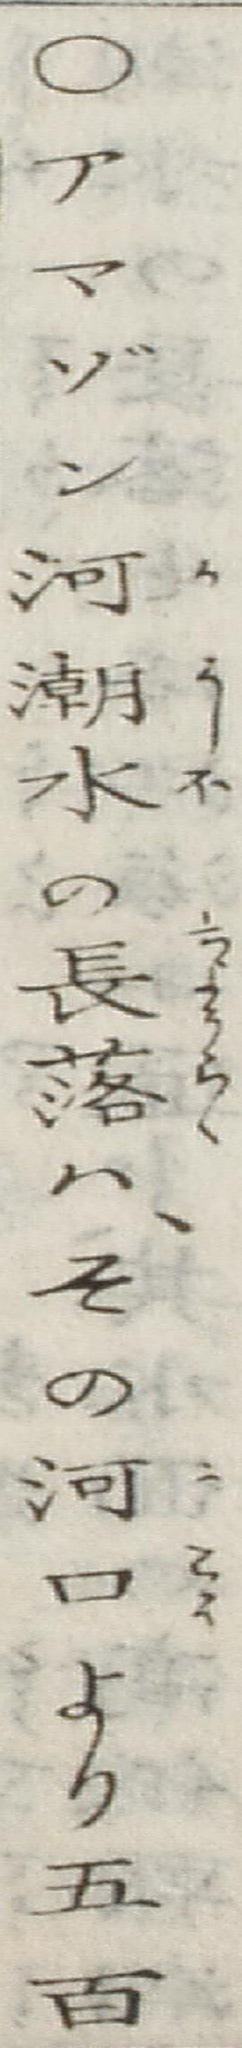○アマゾン河潮水の長落は、その河口より五百
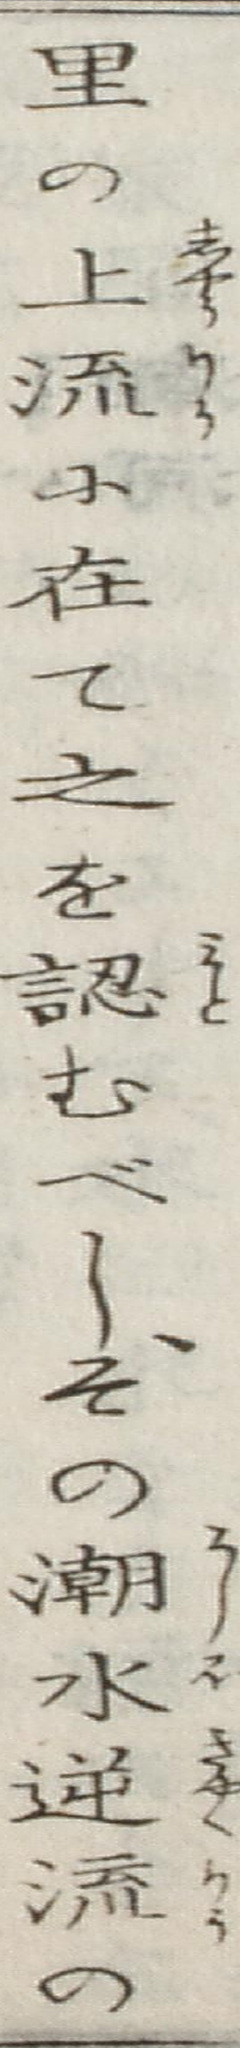里の上流に在て之を認むべし、その潮水逆流の
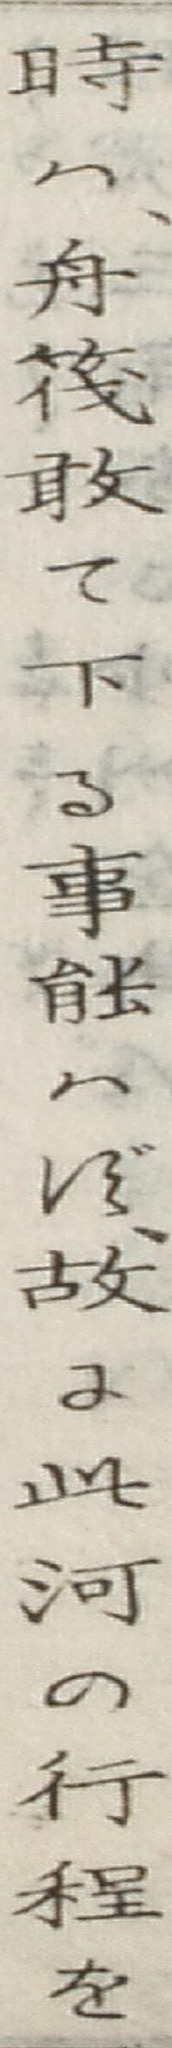時は、舟筏敢て下る事能はず、故に此河の行程を
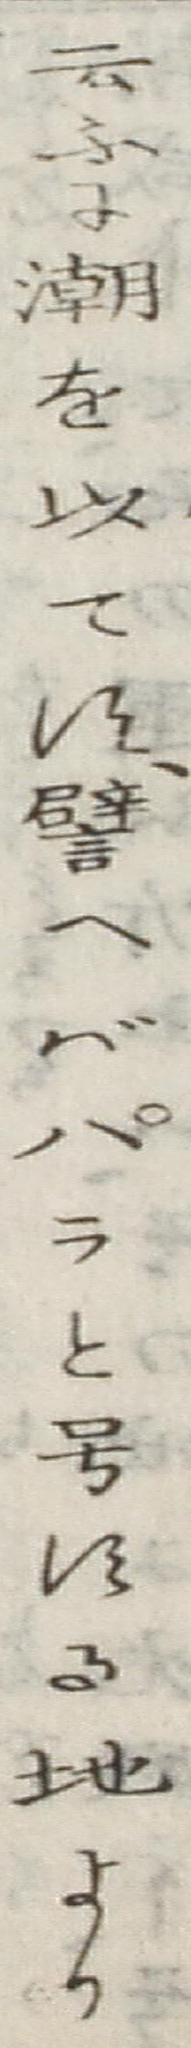云ふに潮を以てす、譬へばパラと号する地より
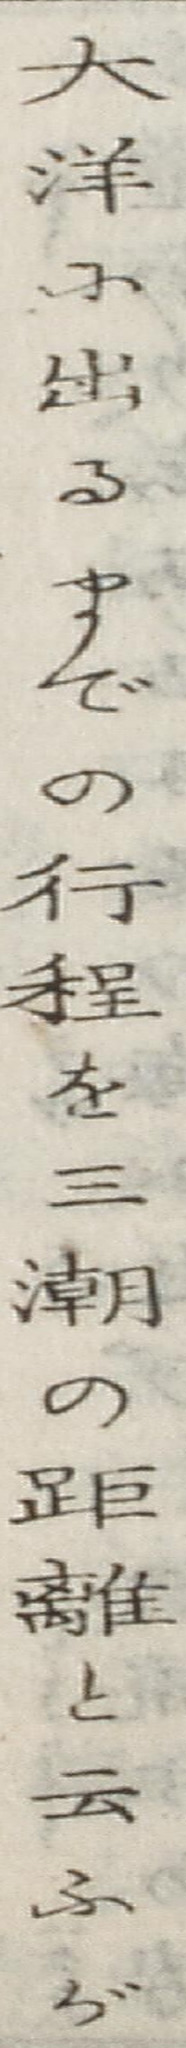大洋に出るまでの行程を三潮の距離と云ふが
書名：訓蒙　天然地理學　中
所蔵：東京大学地震研究所図書室 Earthquake Research Institute Library, The University of Tokyo, JAPAN
